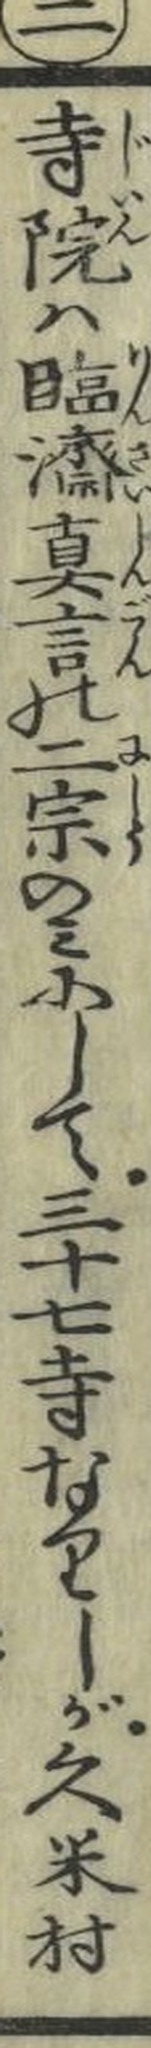寺院は臨濟真言の二宗のみにして・三十七寺なりしが・久米村
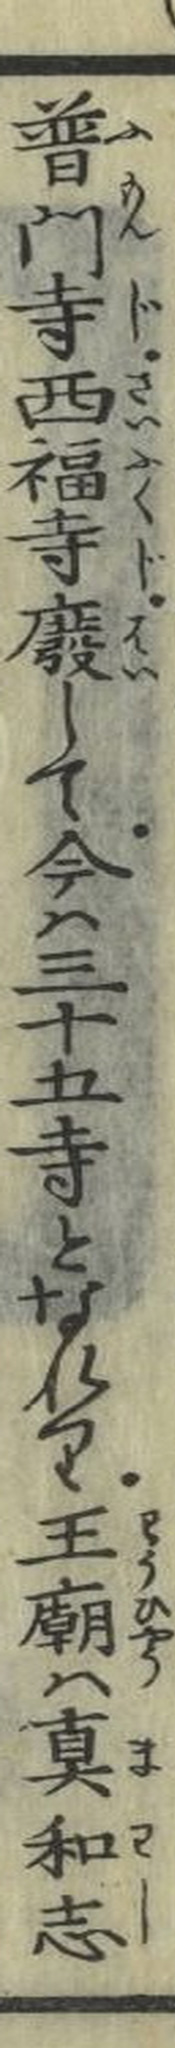普門寺・西福寺・廢して・今は三十五寺となれり・王廟は真和志
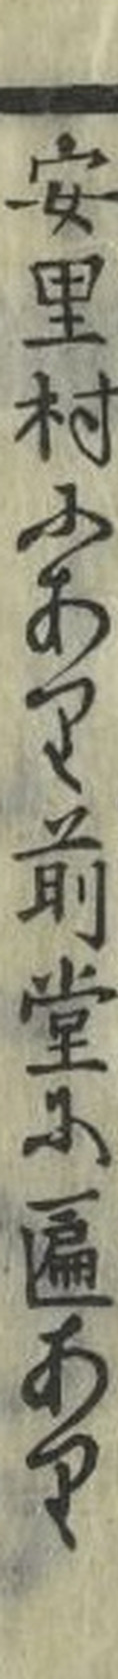安里村にあり・前堂に匾あり
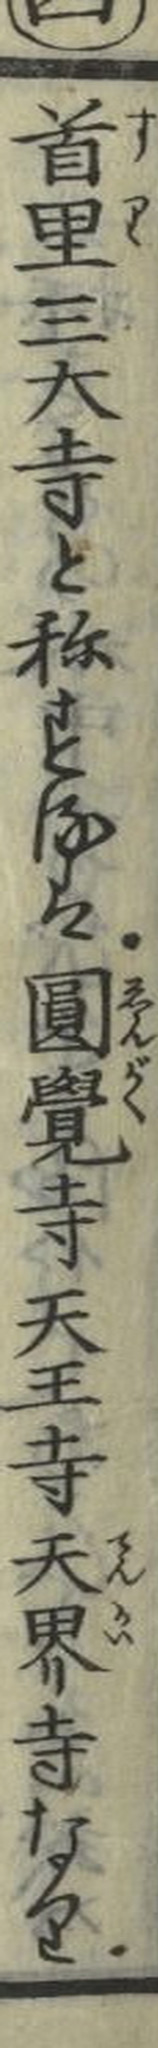首里三大寺と称するは・圓覺寺天王寺天界寺なり・
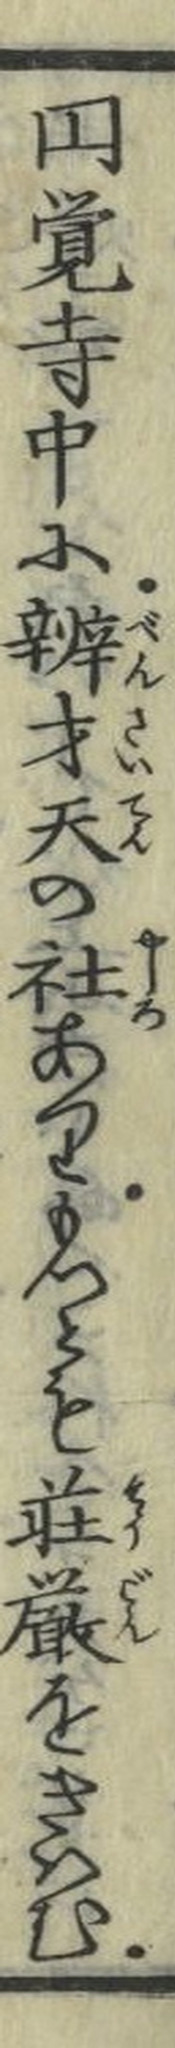円覚寺中に・辨才天の社あり・もつとも荘厳をきはむ・
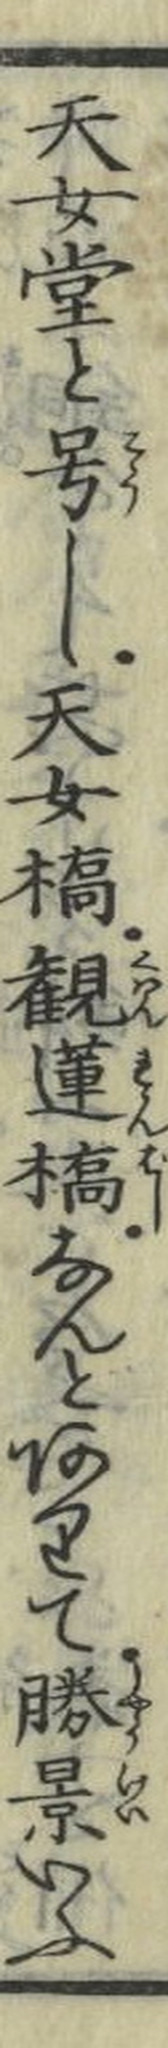天女堂と号し・天女槗・観蓮槗・なんとありて勝景いふ
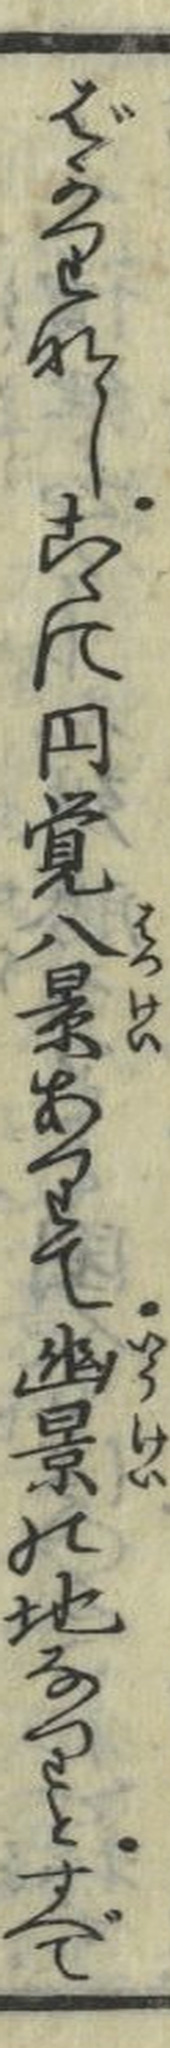ばかりなし・こゝに円覚八景ありて・幽景の地なりと・すべて
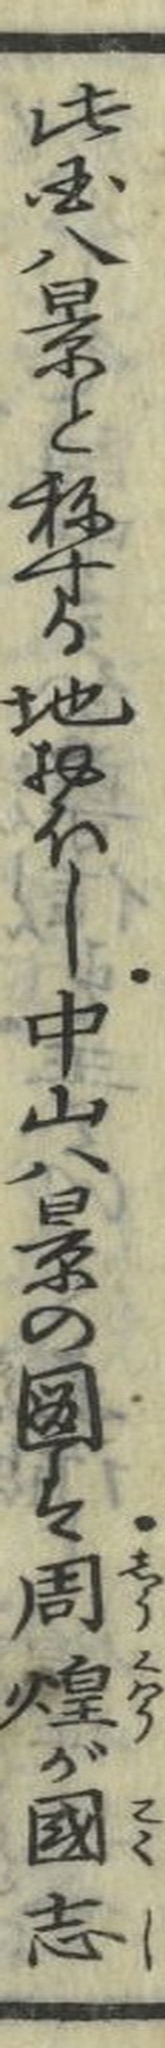此国八景と称する地おほし・中山八景の図は・周煌が國志
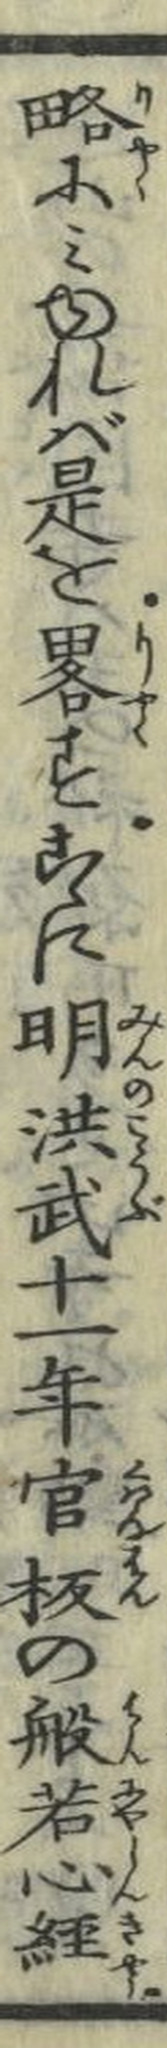略にみゆれば是を・畧す・こゝに明洪武十一年官板の般若心經・
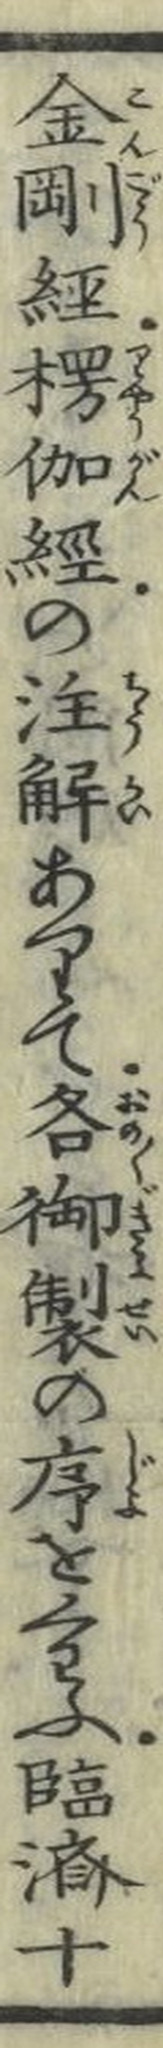金剛經・楞伽經・の注解ありて・各御製の序をくわふ・臨済十
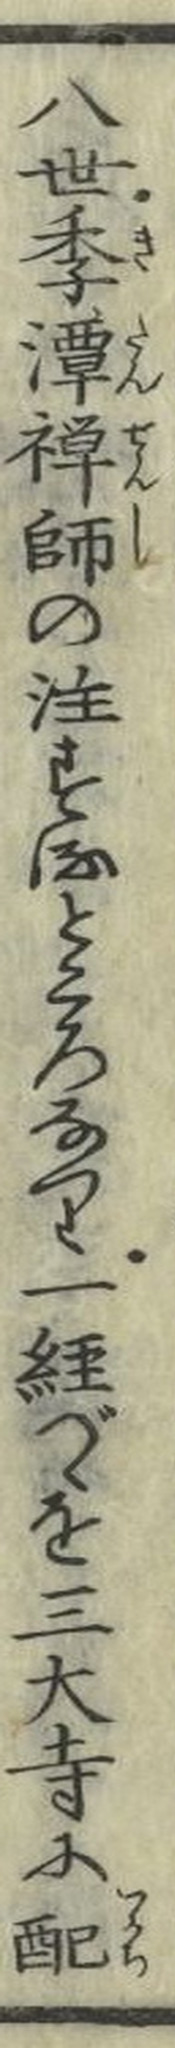八世・季潭禅師の注するところなり・一經づゝを三大寺に配
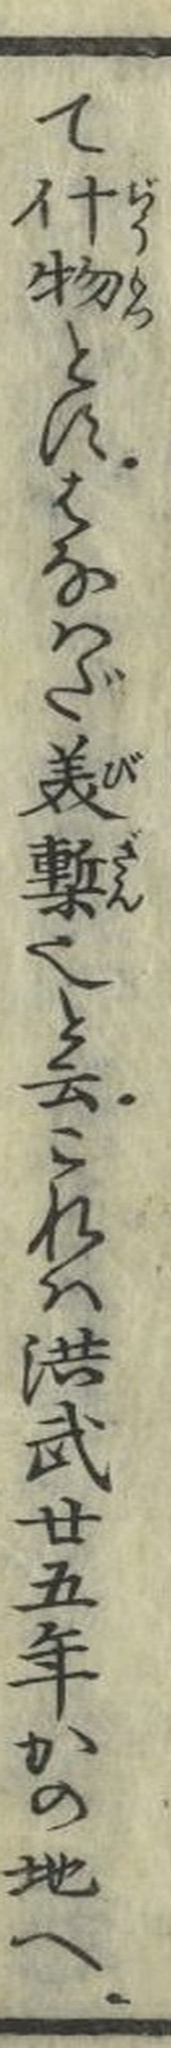て什物とす・はなはだ美槧也と云・これは洪武廿五年かの地へ・
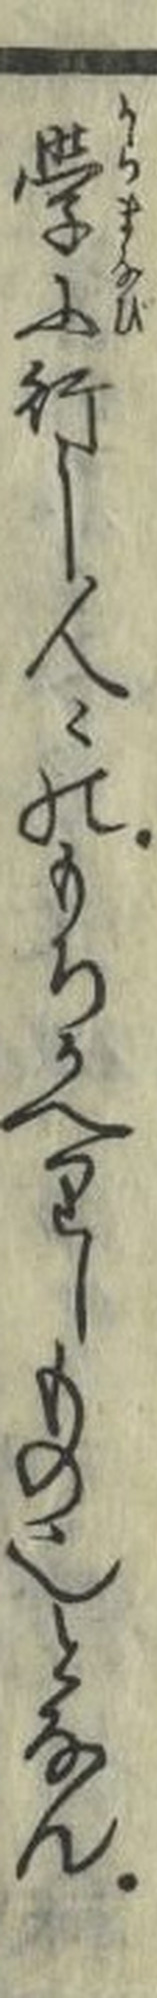學に行し人々のもちかへりしもの也となん・

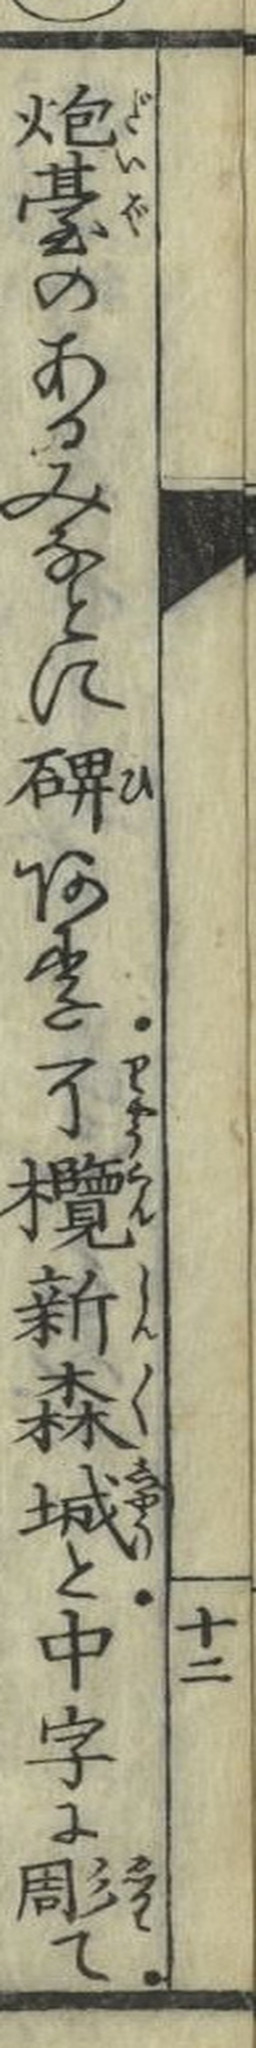炮䑓のあるみなとに碑あり・了欖新森城と・中字に彫て・
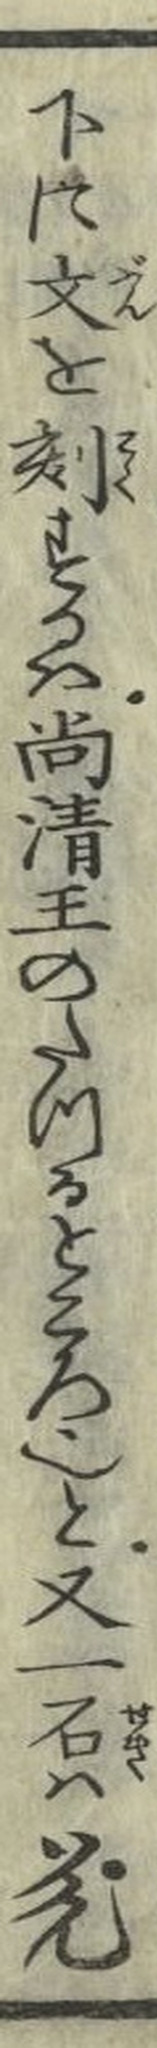下に文を刻するは・尚清王のたつるところ也と・又一石は
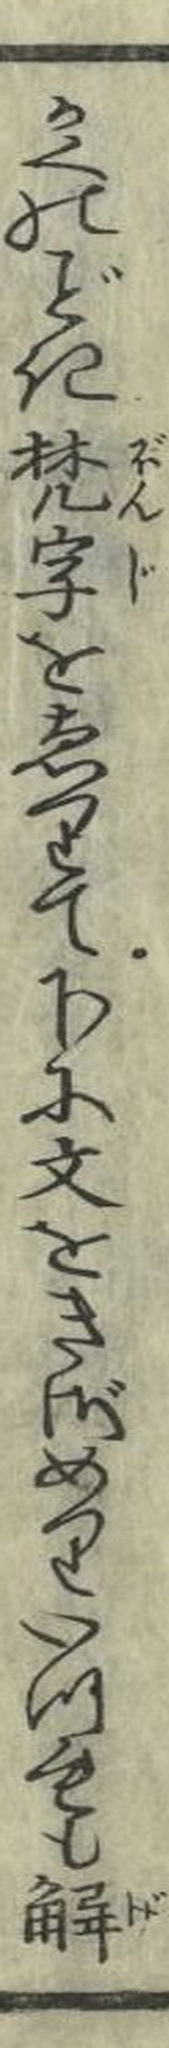かくのごとき梵字をゑりて・下に文をきざめりいつれも解
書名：琉球秊代記 附雑話 全
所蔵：University of the Ryukyus Library
